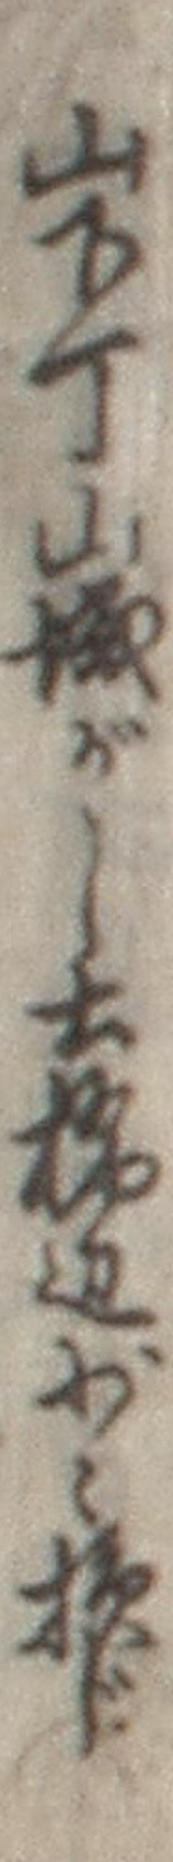山下丁山城がし土橋辺少〻損じ

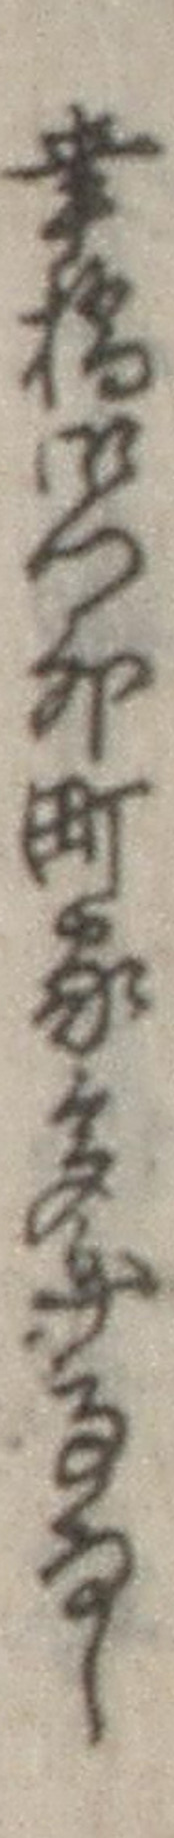幸橋御門外町家多分事なし
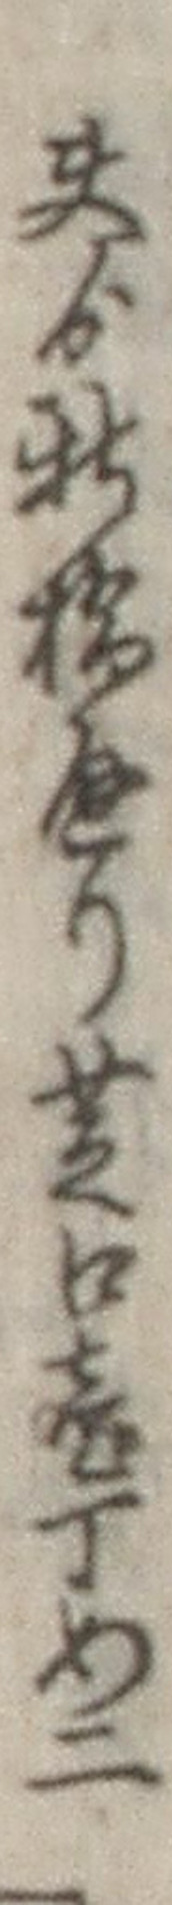夫ゟ新橋通り芝口壱丁め二
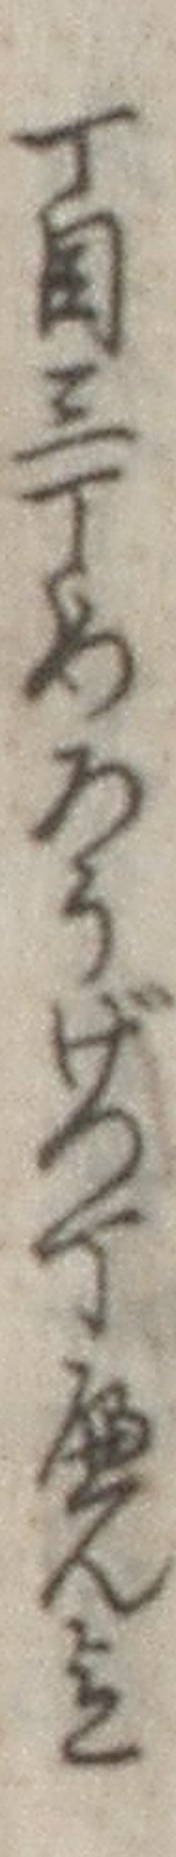丁目三丁めろうげつ丁遍ん迄
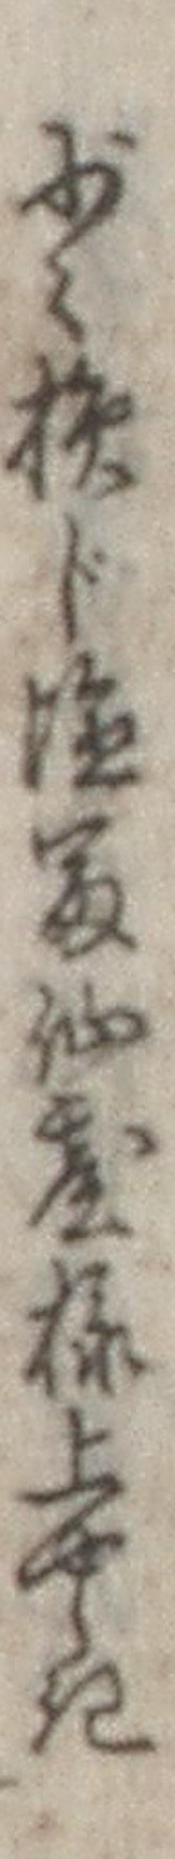少〻損じ塩富仙崖様上やしき
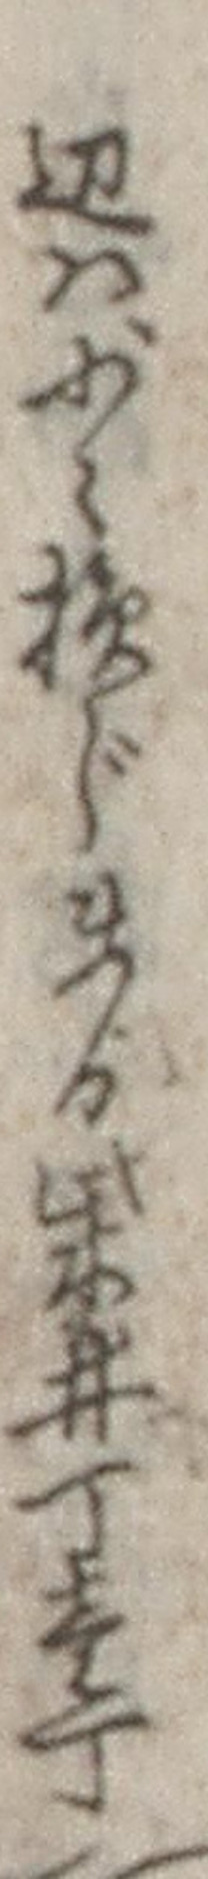辺は少〻損じ夫ゟ柴井丁壱丁
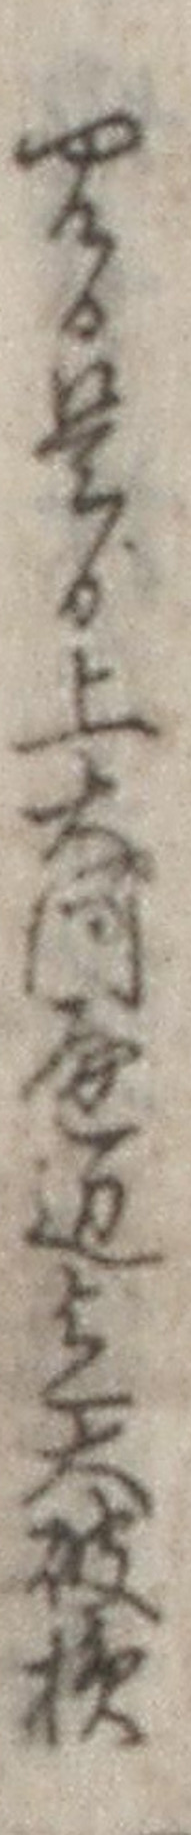やける是ゟ上大門通辺迄大破損
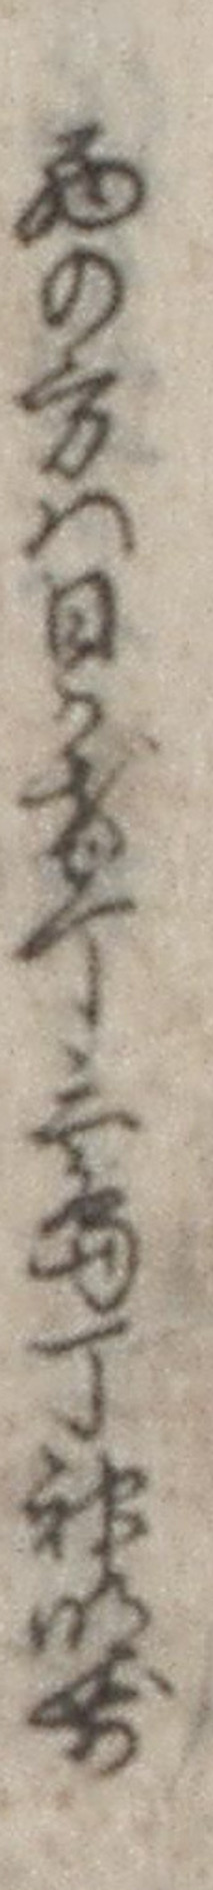西の方は日かお丁三島丁神明前
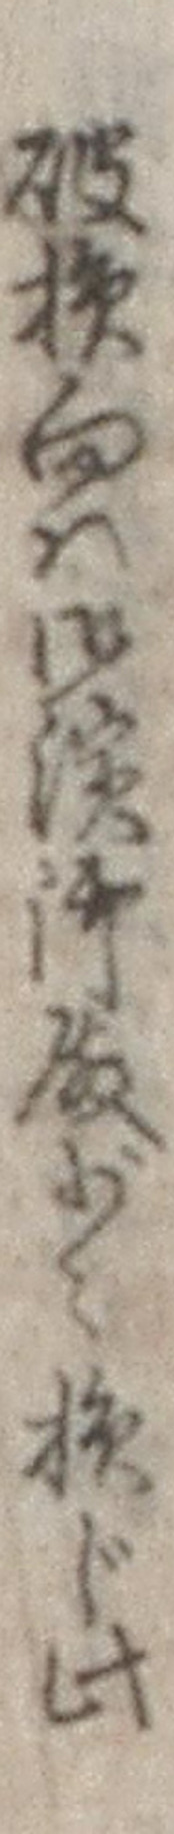破損向は御濱御殿少〻損じ此
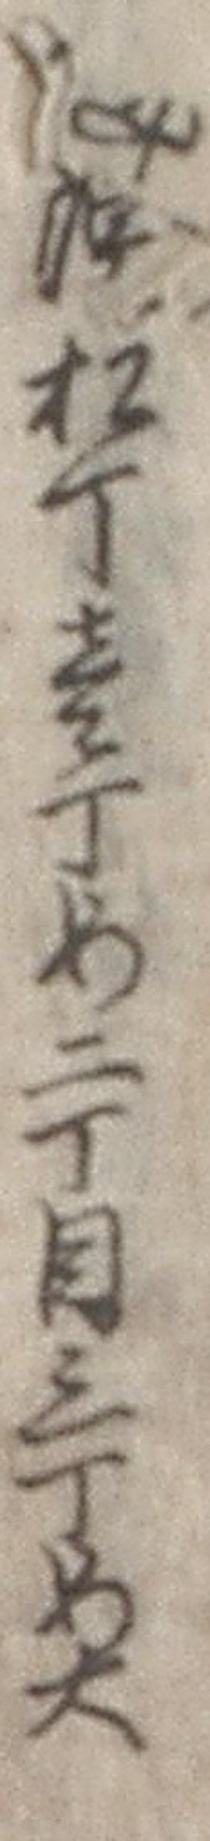濱松丁壱丁め二丁目三丁め大
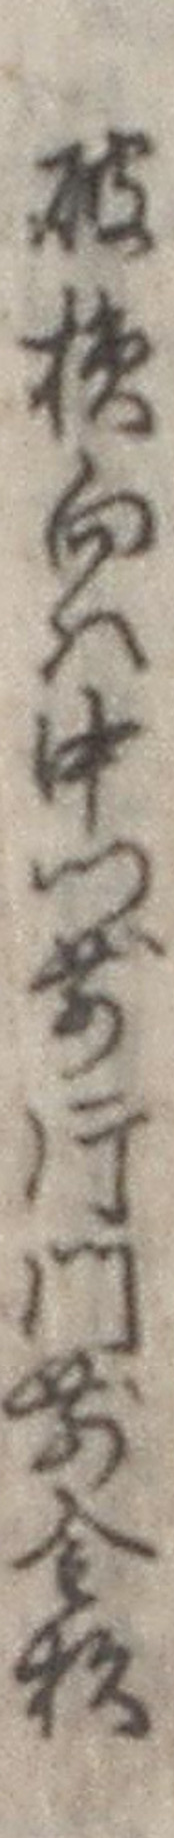破損向は中門前片門前金杉
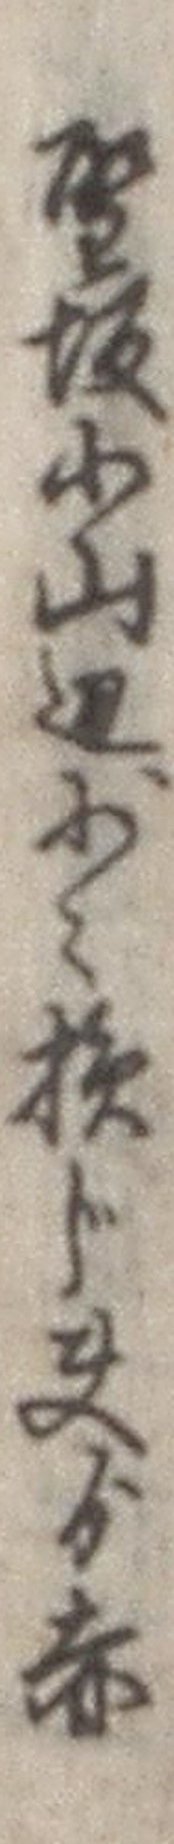聖坂小山辺少〻損じ夫ゟ赤
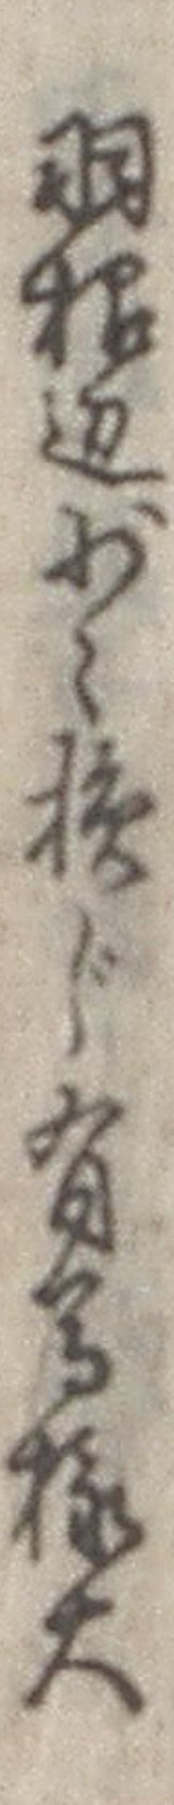羽根辺少〻損じ有馬様大
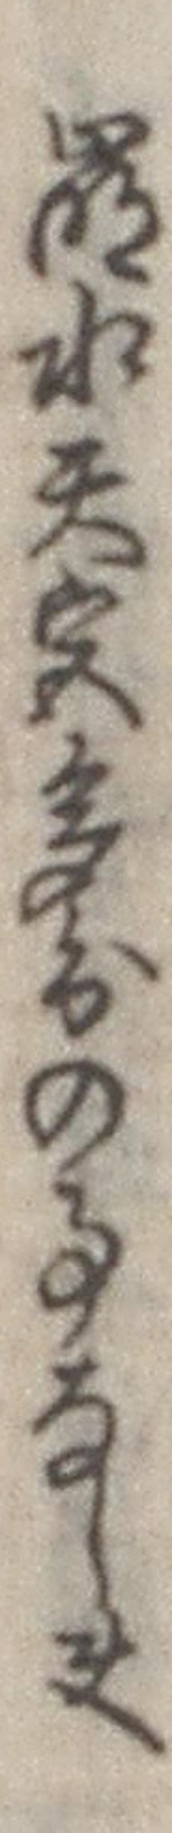崩水天宮多分の事なし夫
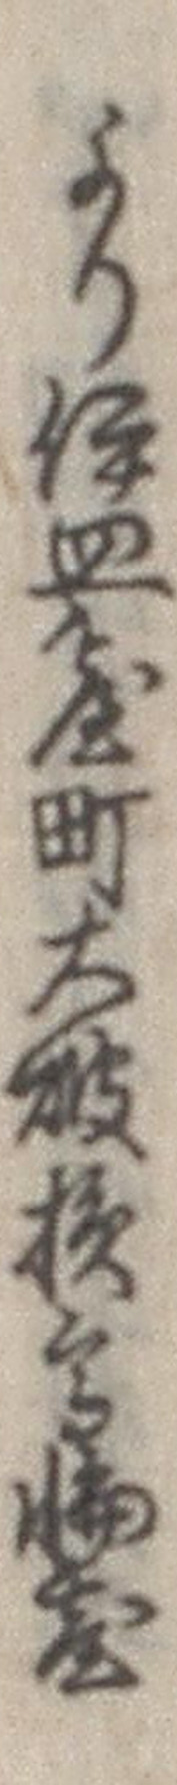より伊皿臺町大破損高輪臺
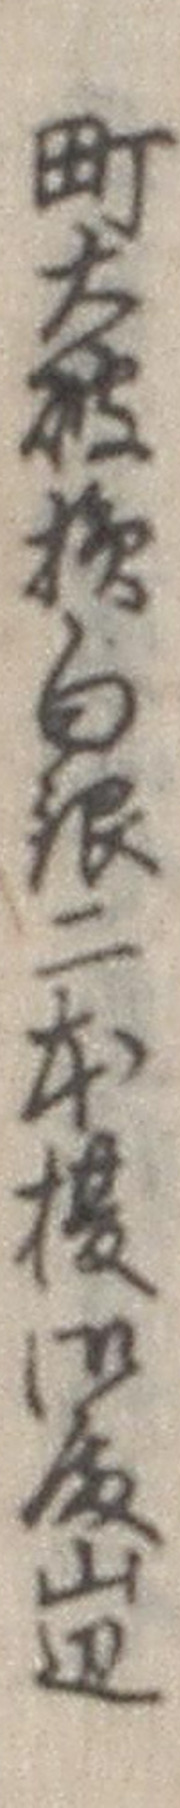町大破損白銀二本榎御殿山辺
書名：江戸　大地震臣細録　全
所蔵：東京大学地震研究所図書室 Earthquake Research Institute Library, The University of Tokyo, JAPAN
